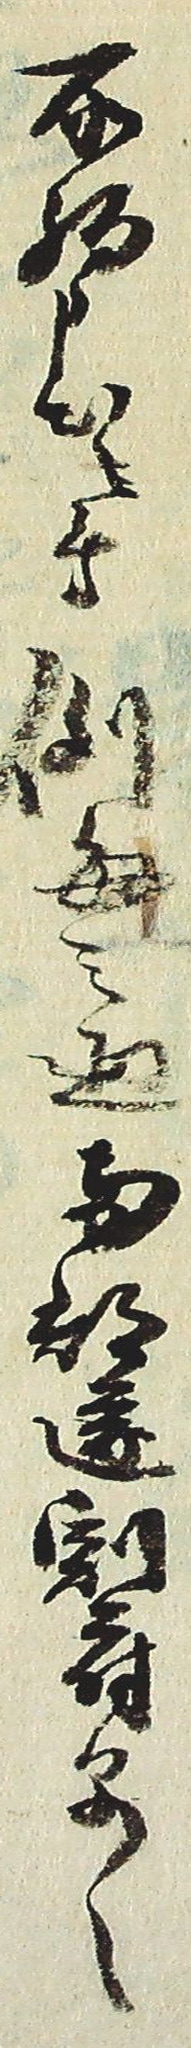取約申出候に付例毎之通両郡遂割苻早々
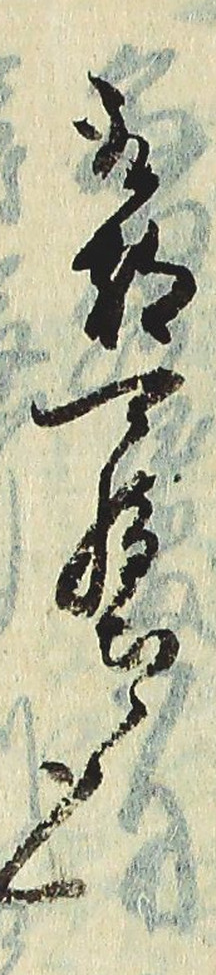取都可指出候以上
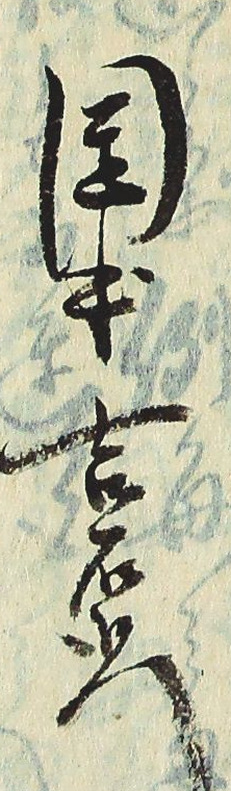岡本吉右衛門
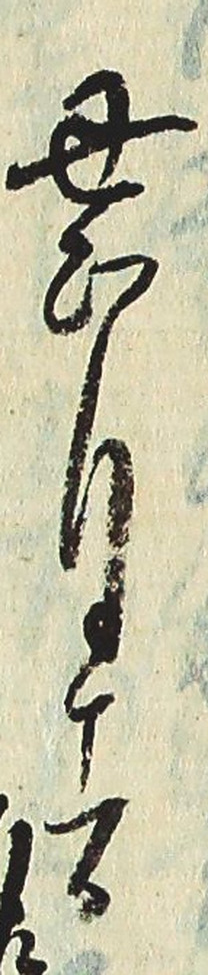丑正月十一日
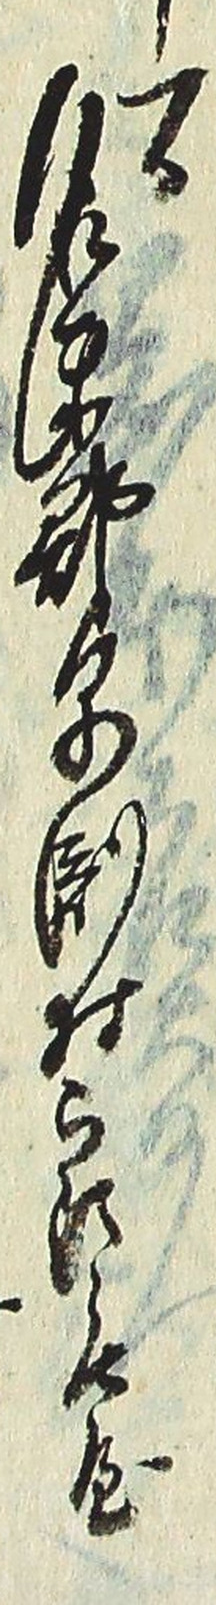名東郡早淵村与頭庄屋
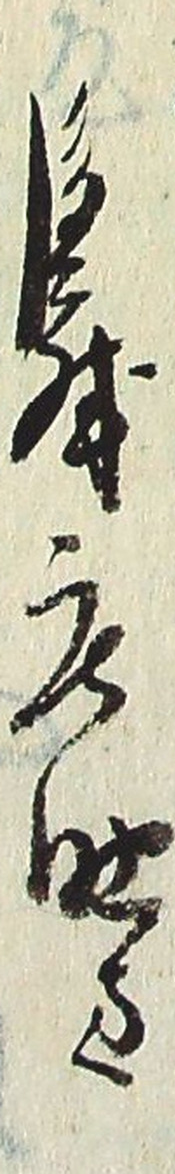後藤庄助方へ
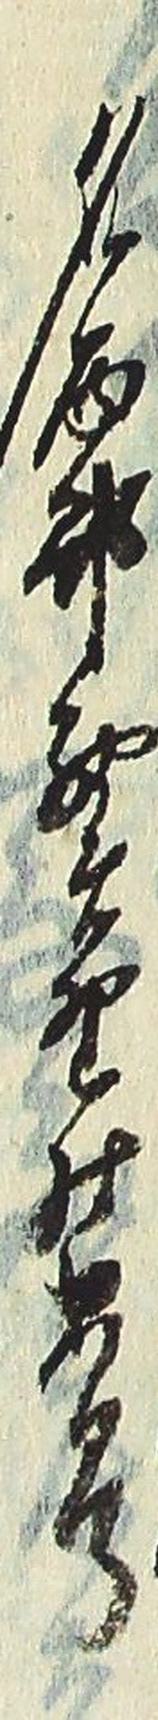名西郡西矢野村右同断
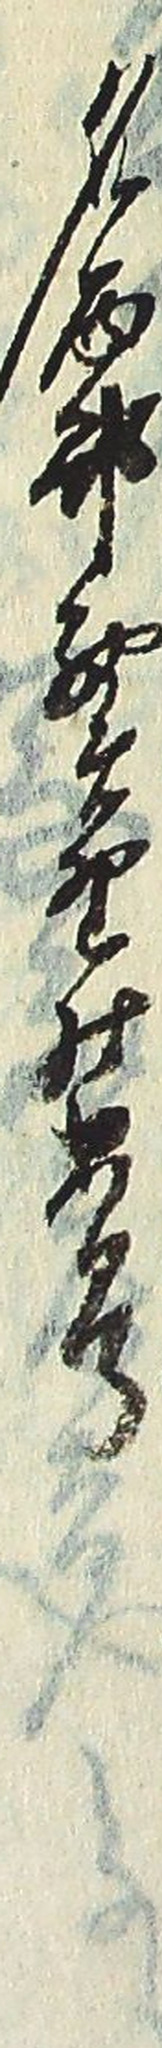名西郡西矢野村右同断

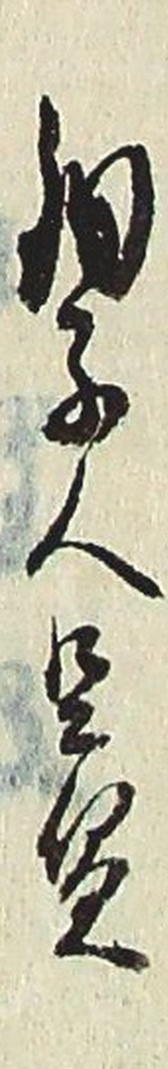銅子人足賃
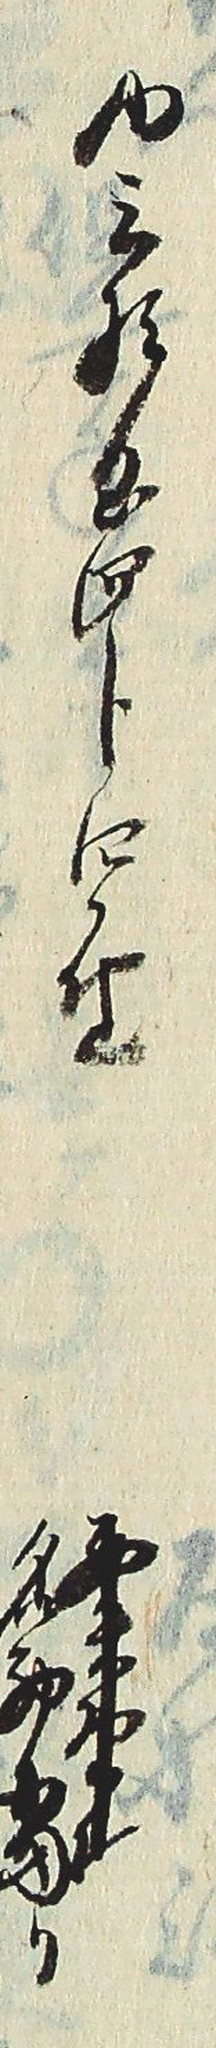内三拾匁四分四厘名西当り
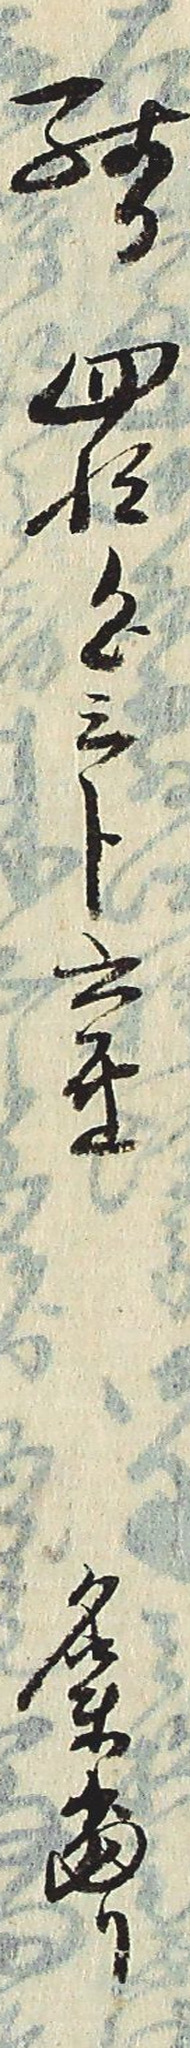残り四拾匁三分六厘名東当り
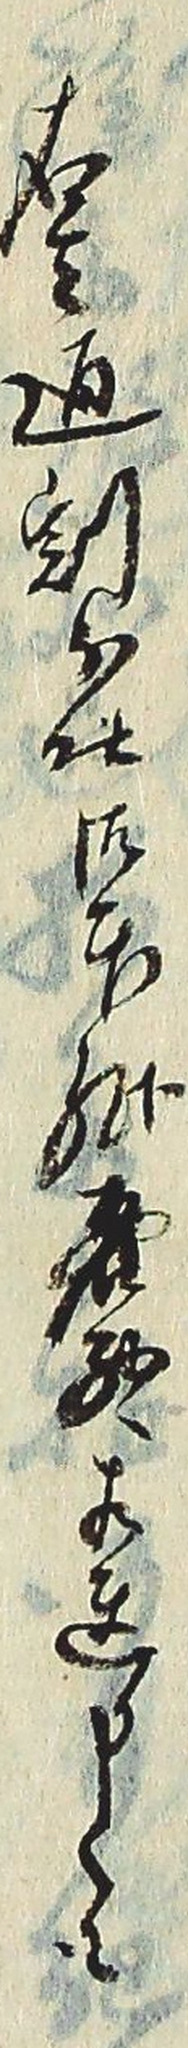右之通割分仕御本紙名西へ相達申候以上
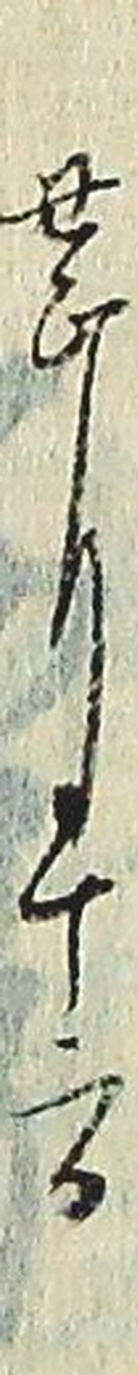丑正月十二日
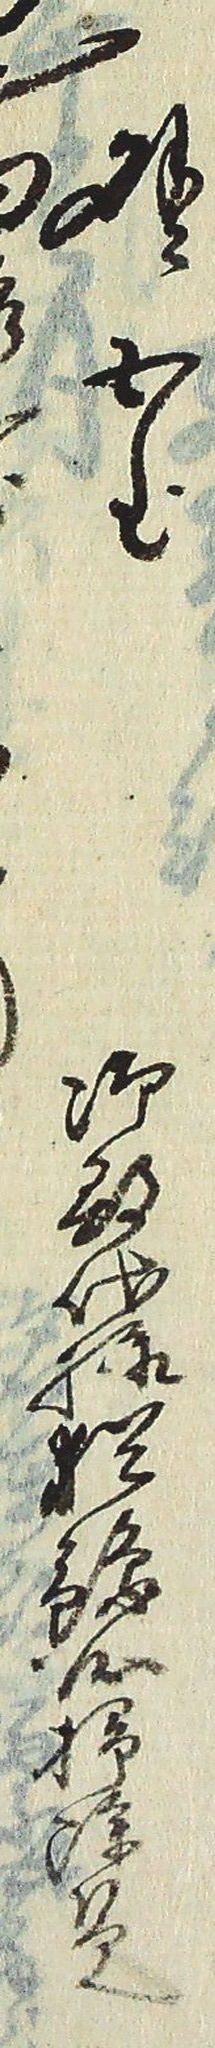外に五匁御郡代様猶予所掃除賃
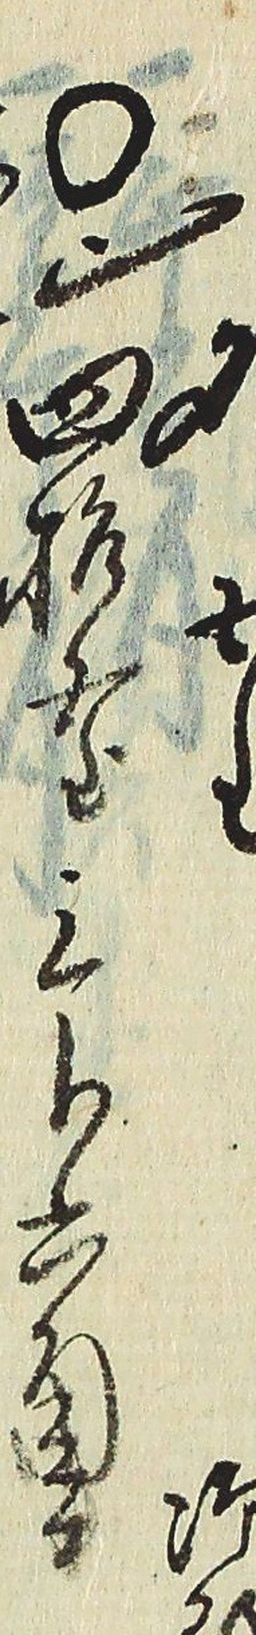〆四拾五匁三分六厘
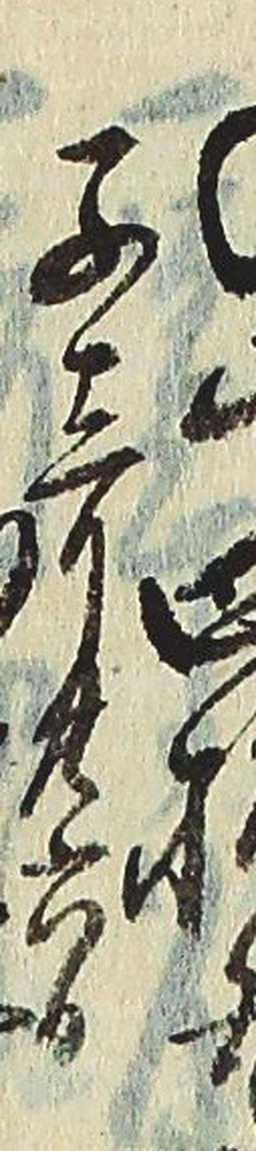子十二月廿六日
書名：名東郡中諸割賦元帳
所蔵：鳴門教育大学 Naruto University of Education
